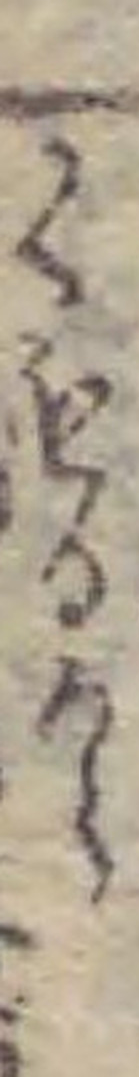くもるから
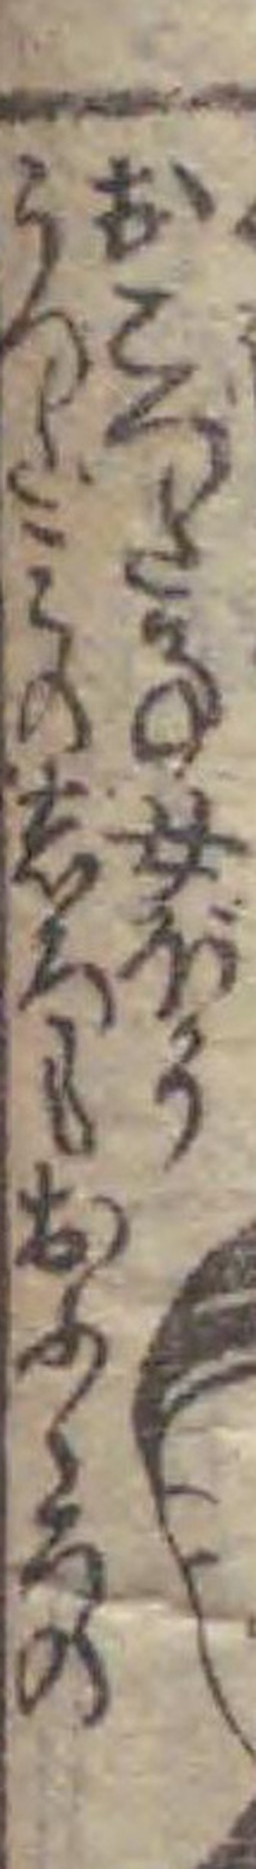うつたみのしろもおふくろの
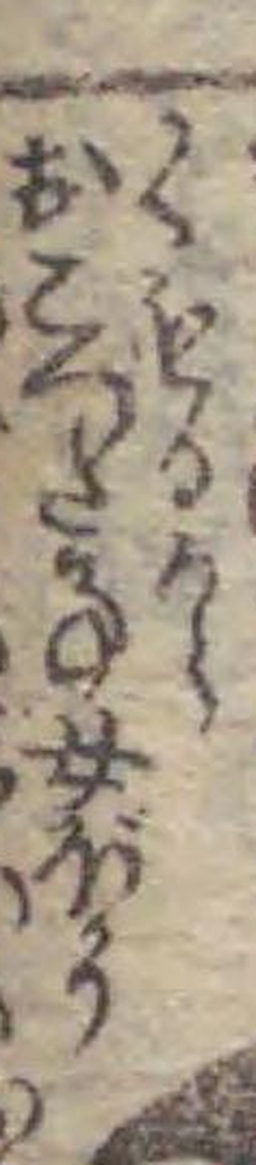おこつた事女ぼう
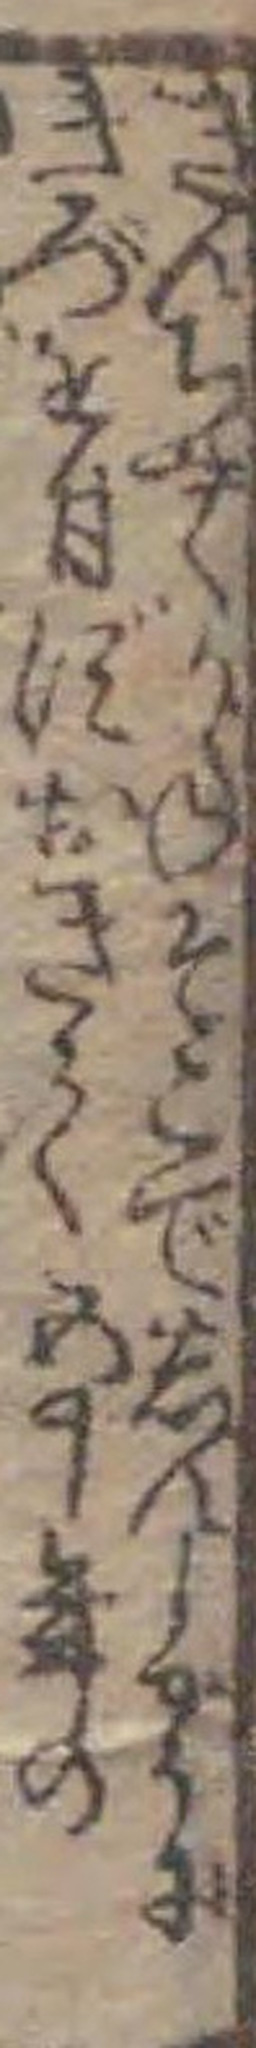きづを付ずおきて五十年の
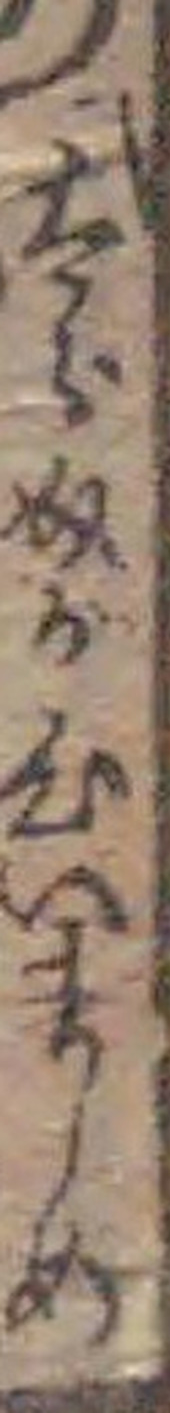〽太郎介が心いましめ
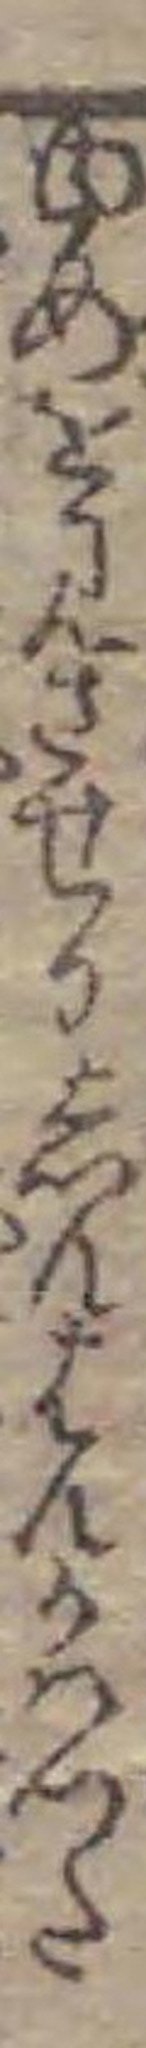ゆめを見させるしんはんかはつた
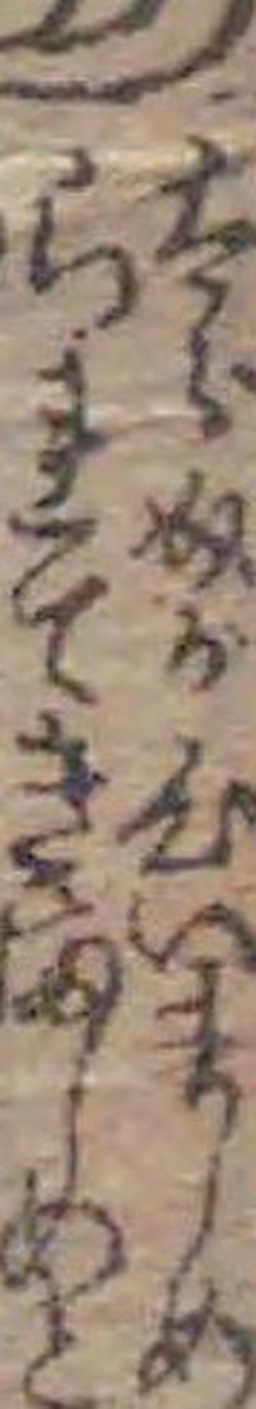られてきましめと
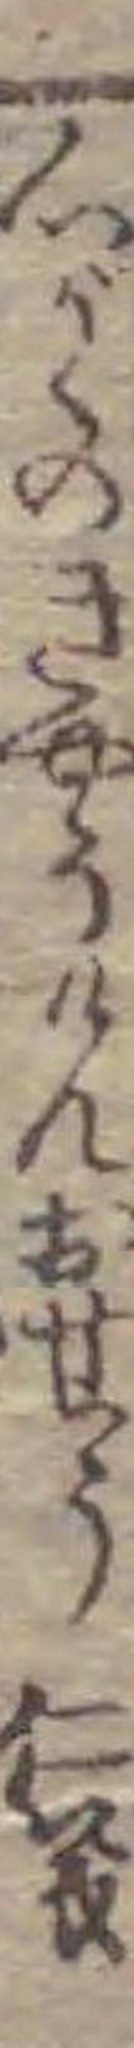心がくのきやうけんおせう仁義
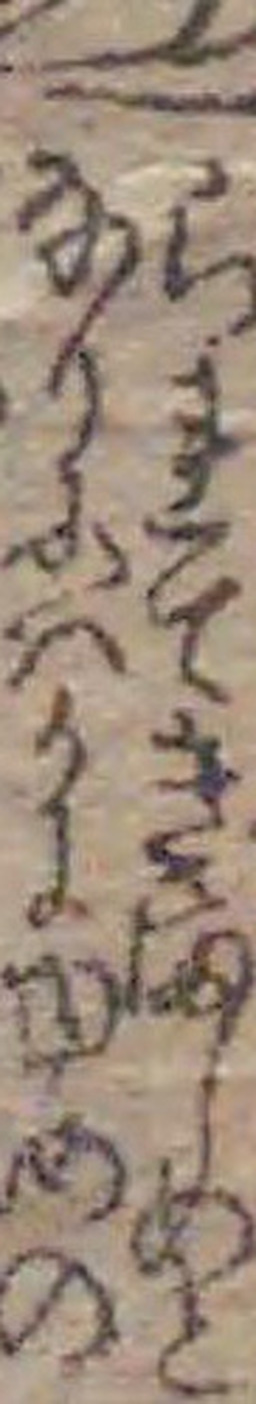なりしにいかにゆめの
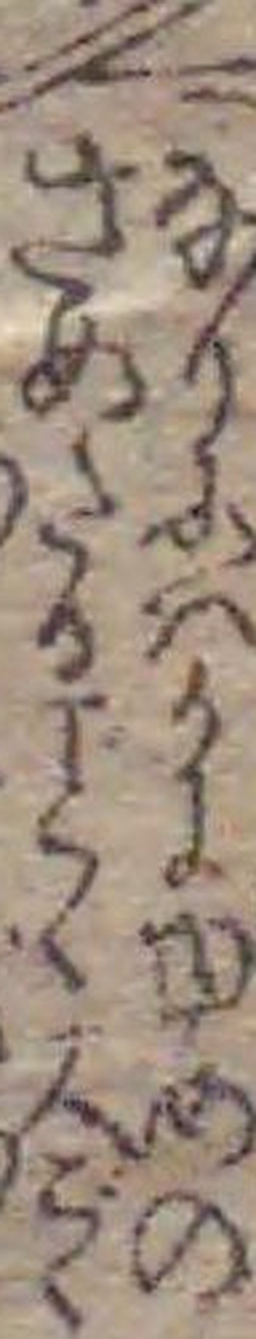さめたるごとく大ごく
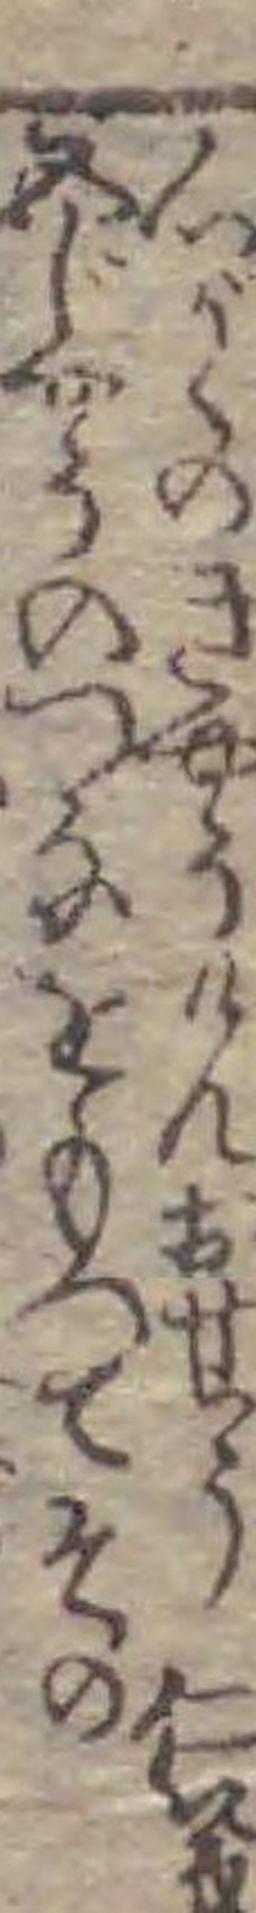五じやうのつなをもつてその
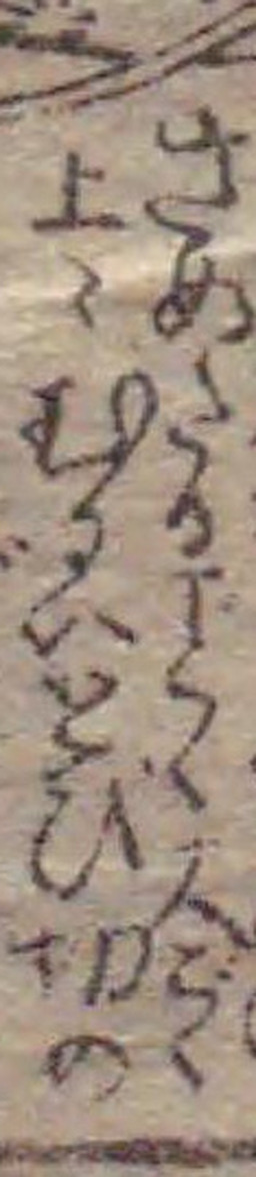上々むるいとび切の
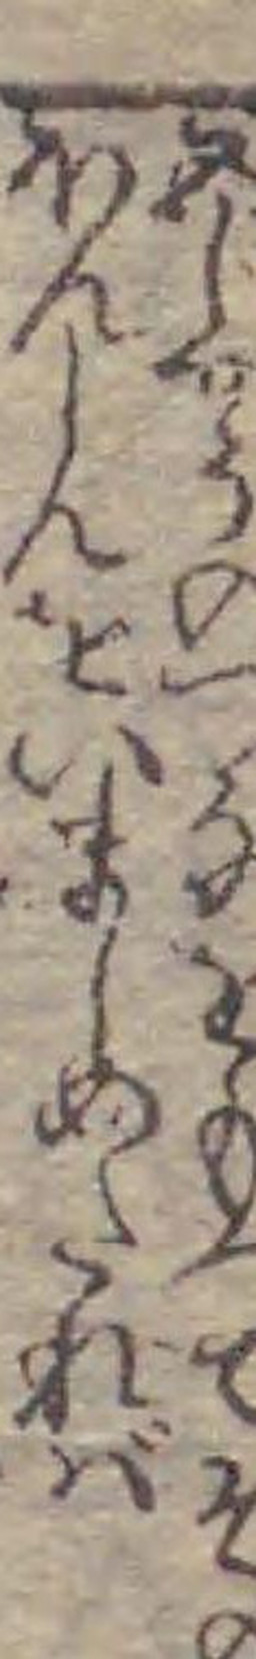ほんしんをいましめたれば
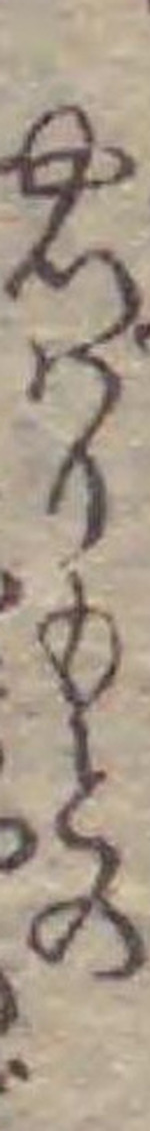やつぱりもとの
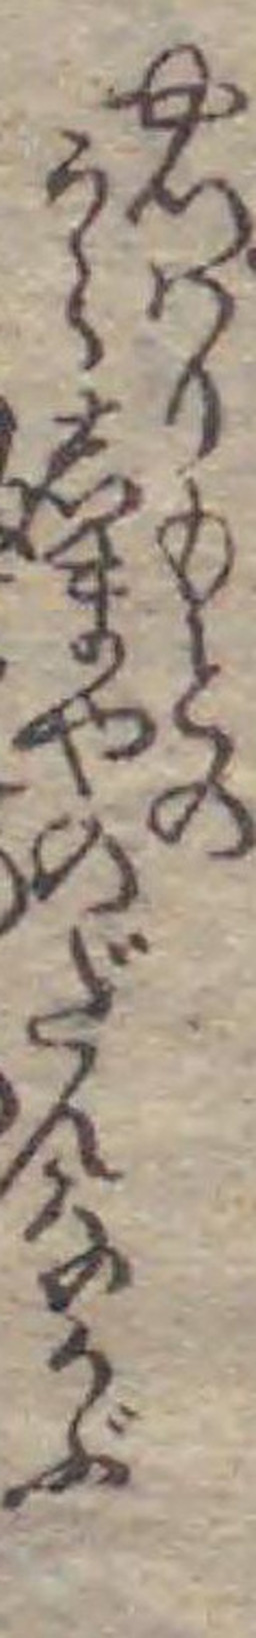うらしまやのだんなかぶ
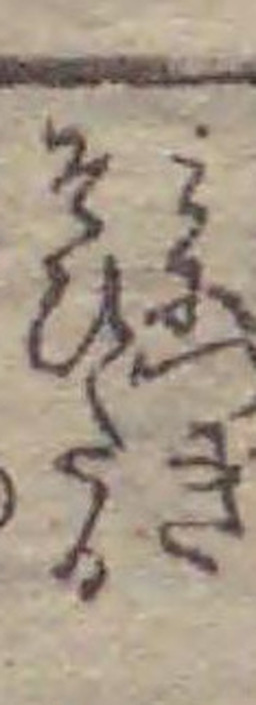そひたる
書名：四遍搨心学草帋 : 3巻
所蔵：国立国会図書館 National Diet Library, JAPAN
